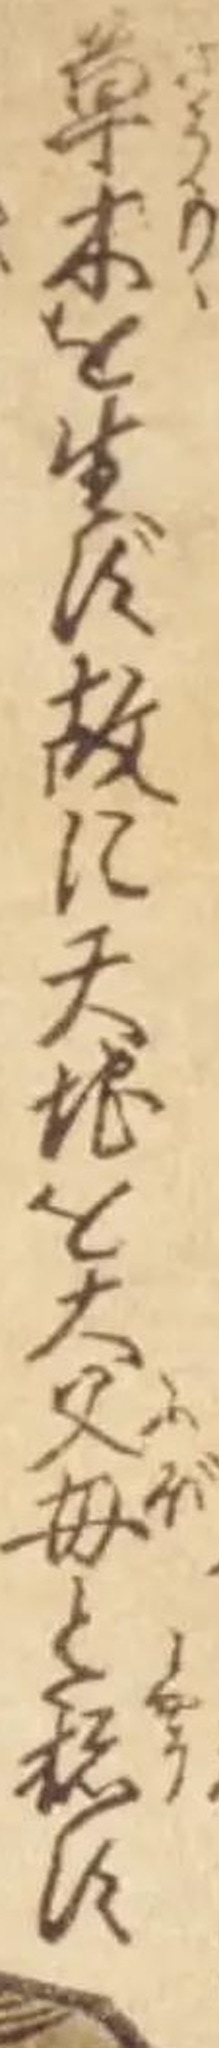草木を生ず故に天地を大父母と称す
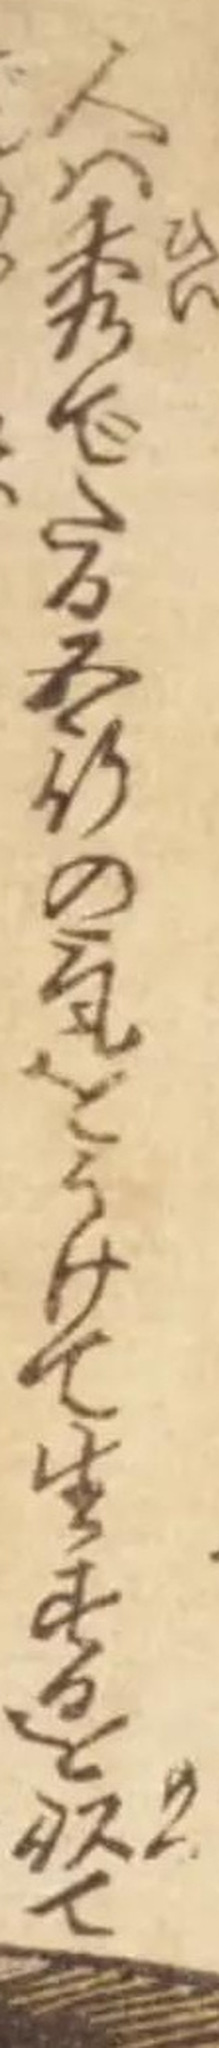人は秀でたる五行の気をうけて生するを以て
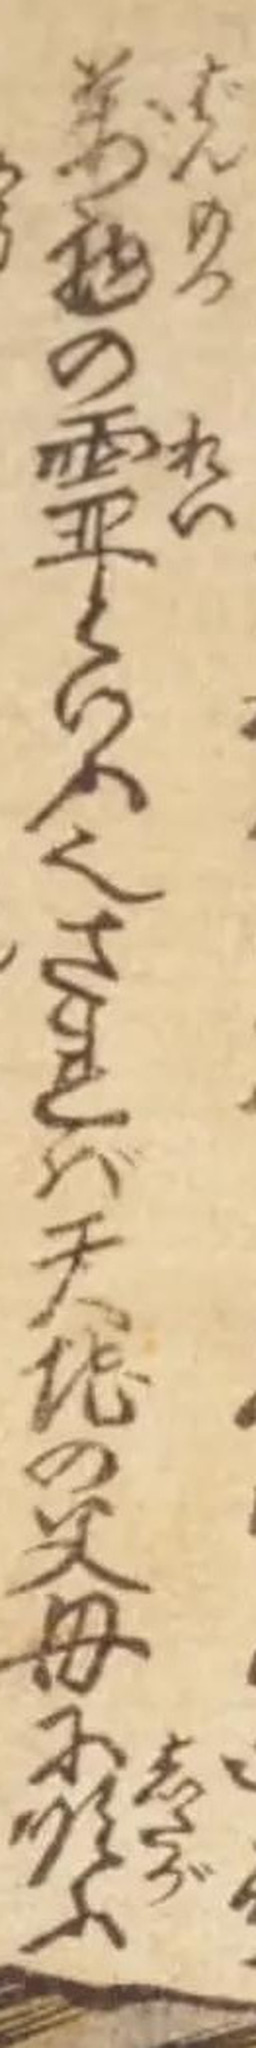万物の霊といふ也されば天地の父母に順ふ
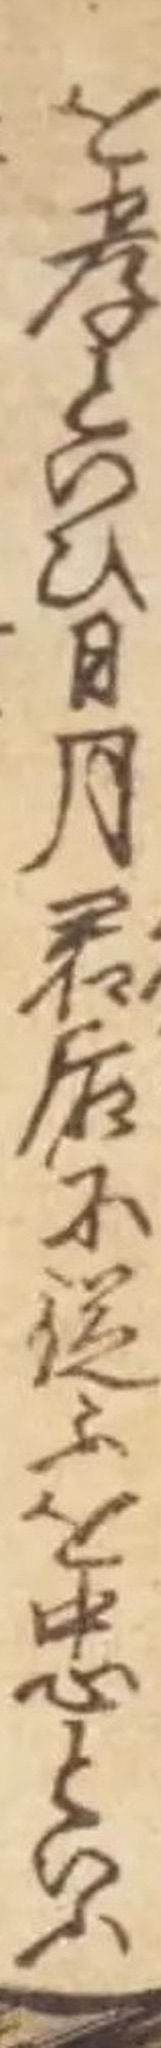を孝といひ日月君侯に従ふを忠といふ
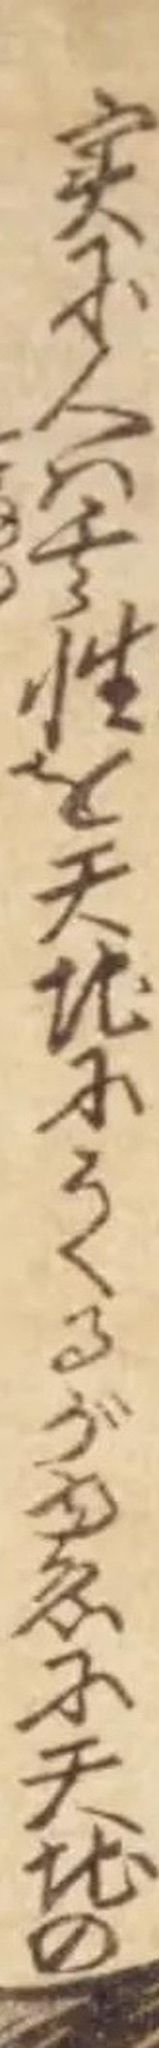実に人は其性を天地にうくるがゆゑに天地の
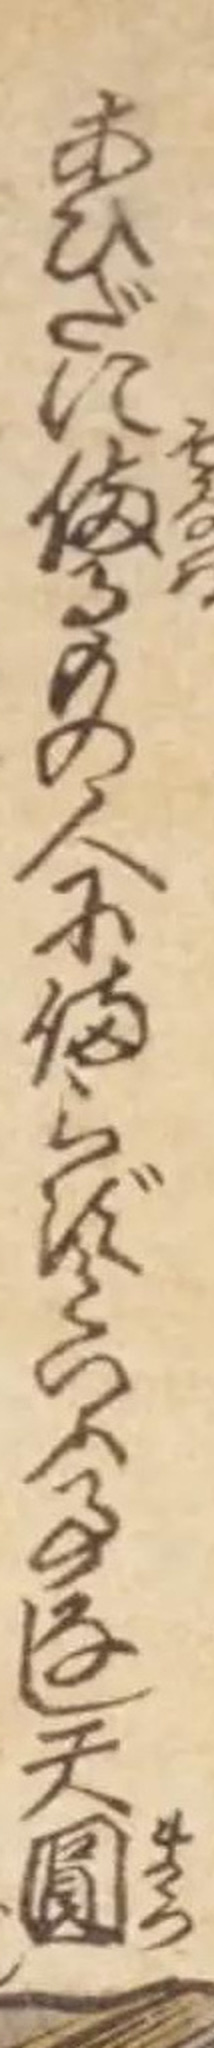あひだに備るもの人に備らずといふ事なし天圓
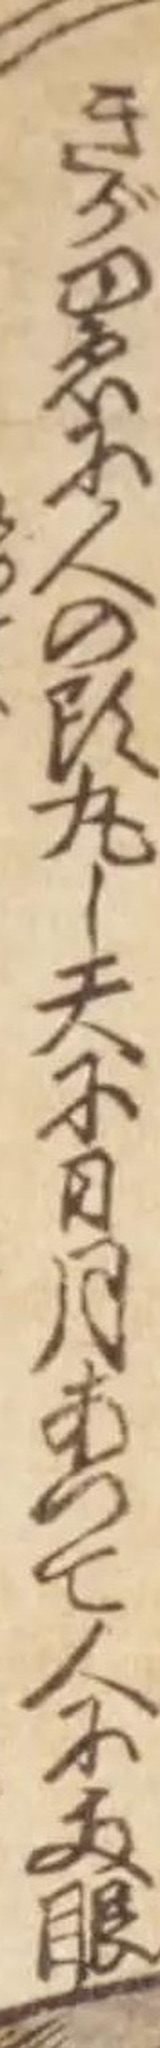きがゆゑに人の頭丸し天に日月あつて人に両眼
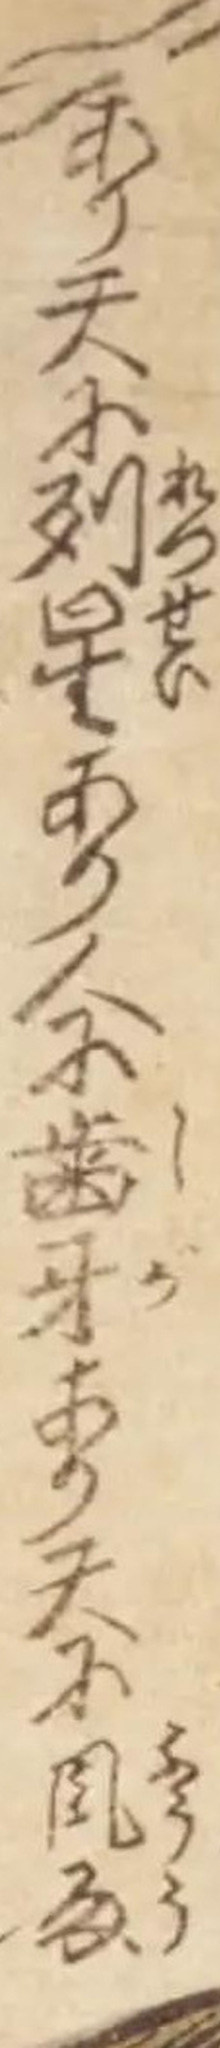あり天に列星あり人に歯牙あり天に風雨
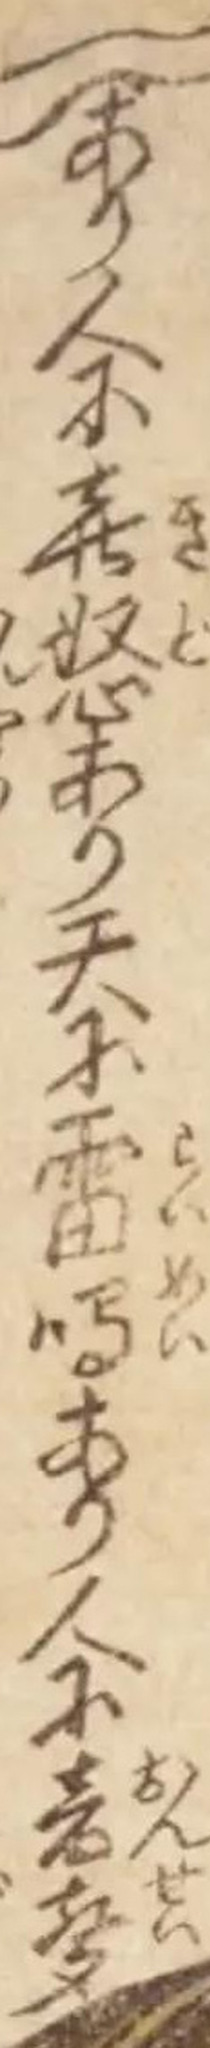あり人に喜怒あり天に雷鳴あり人に音声
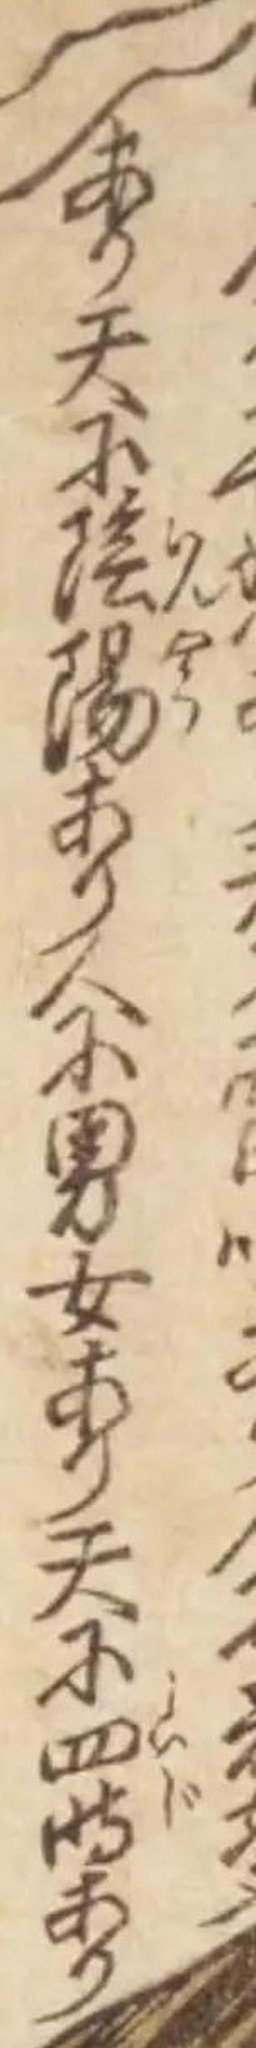あり天に陰陽あり人に男女あり天に四時あり

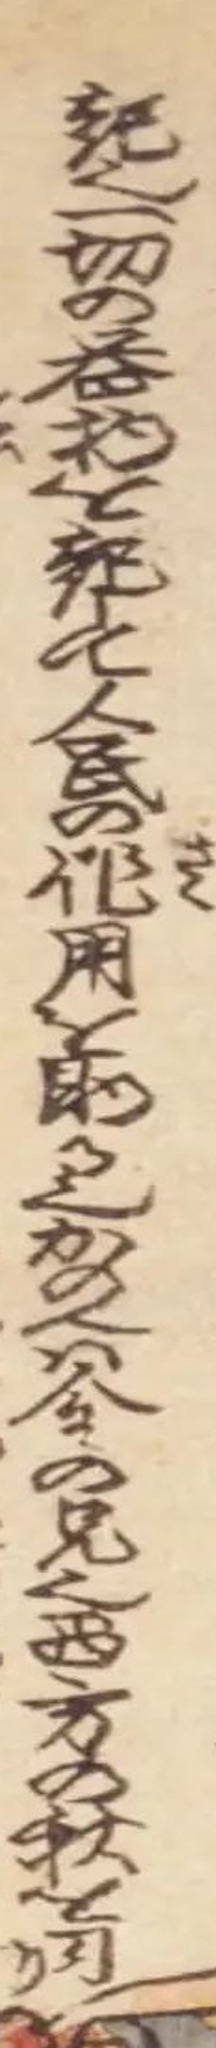起也一切の器物を起して人民の作用を助る也かのへは金の兄也西方の秋を司り
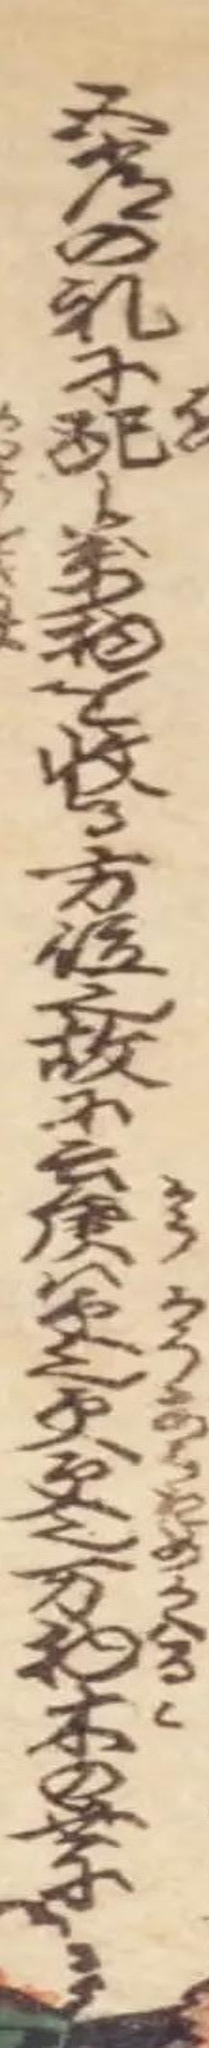五常の礼に配し万物を収る方位也故に云庚は更也更更也万物木の世に
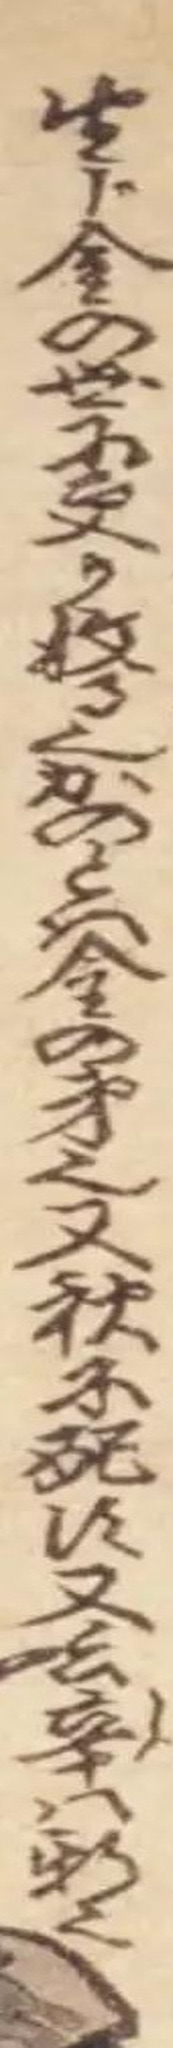生じ金の世に更り収る也かのとは金の弟也又秋に配す又云辛は新也
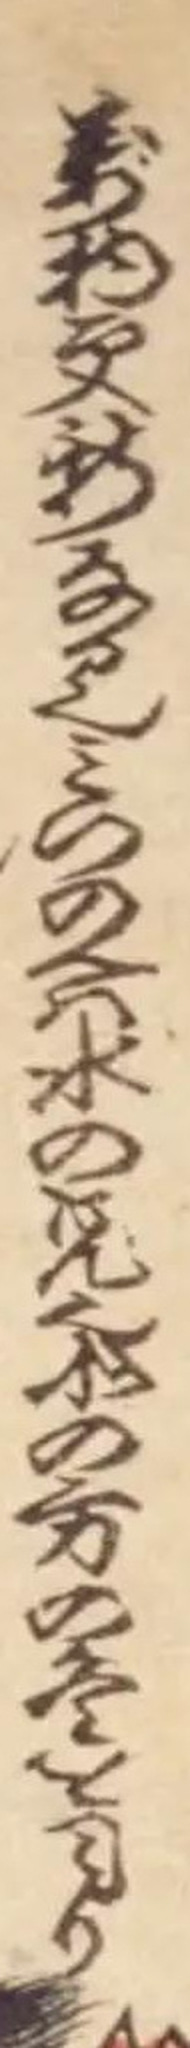万物更新なる也みつのへは水の兄也北の方の冬を司り
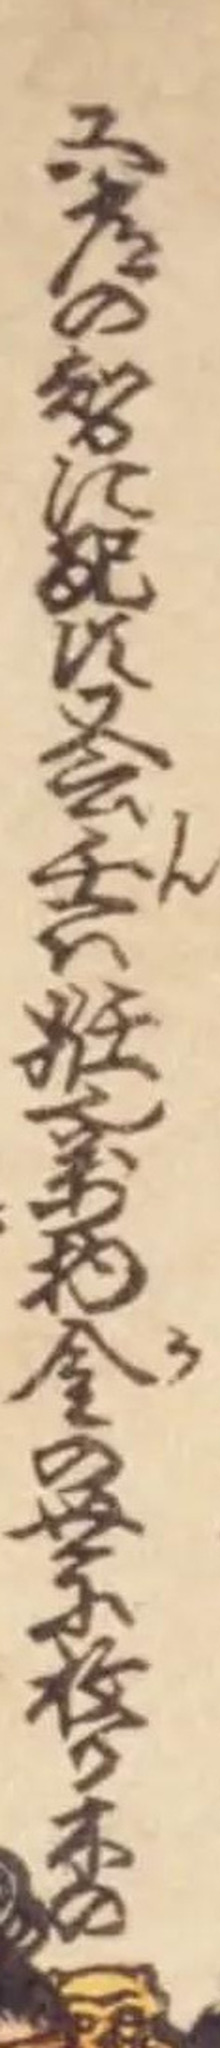五常の智に配す又云壬は拰也万物金の世に収り木の
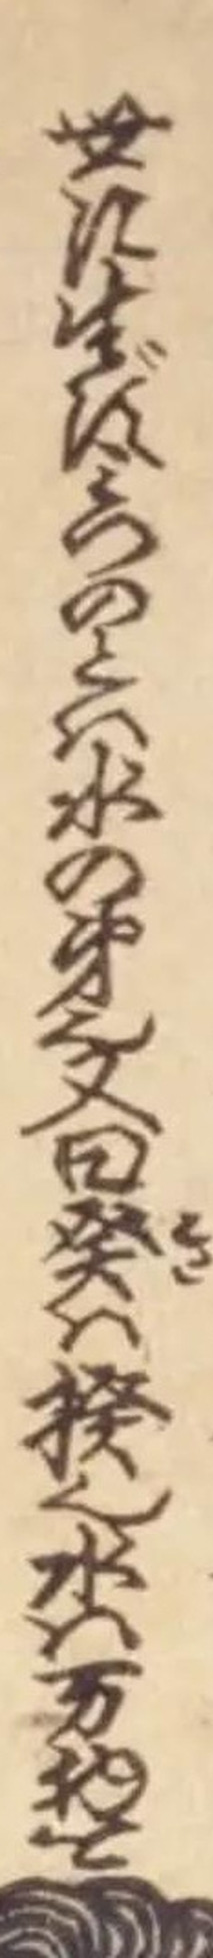世に生ずみつのとは水の弟也又曰く癸は揆也水は万物を
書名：地震吉凶之弁
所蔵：国立国会図書館 National Diet Library, JAPAN
